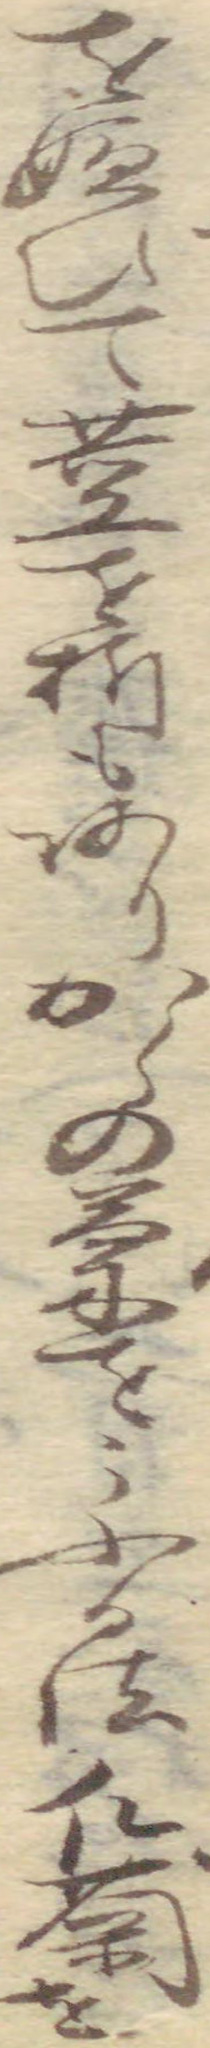を嫌ひて茎を折もありからの菊をうふる法凡菊を
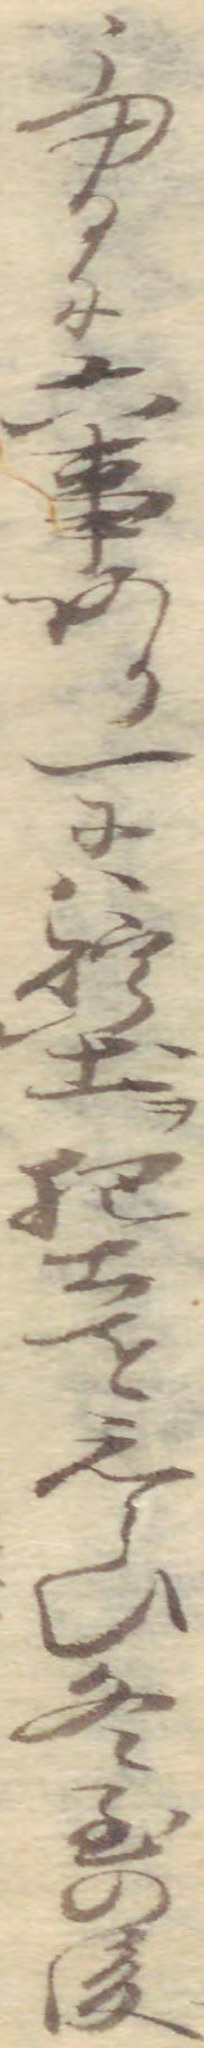うゆるに六事あり一にハ貯土肥土をえらひ冬至の後
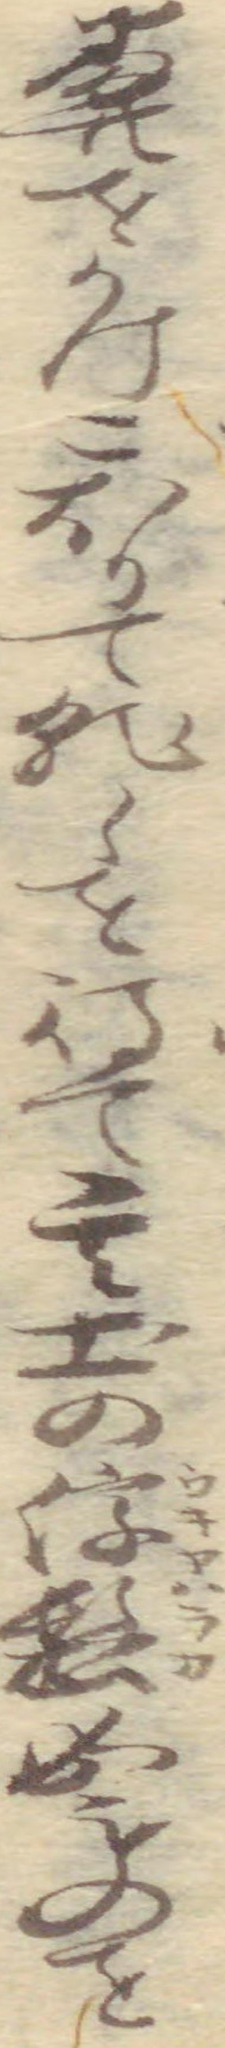糞をかけこほりて乾くを待て其土の浮鬆成ものを
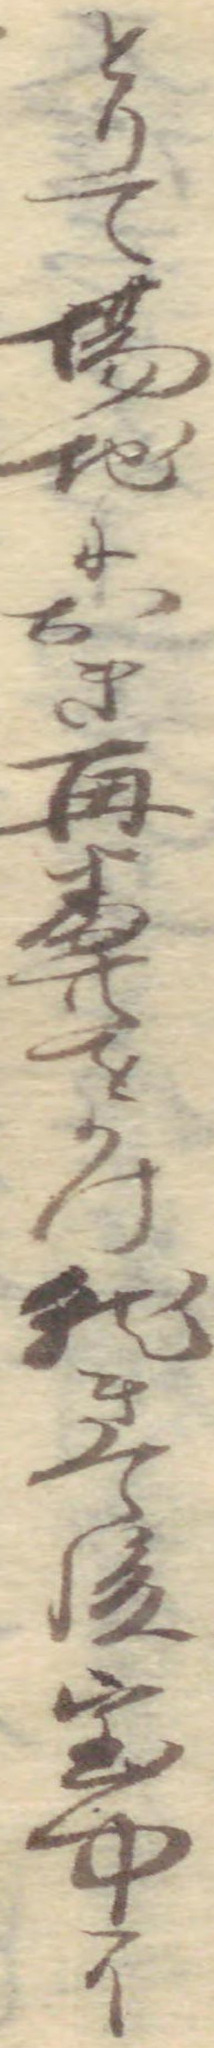とりて場地におき再糞をかけ乾きて後室中に
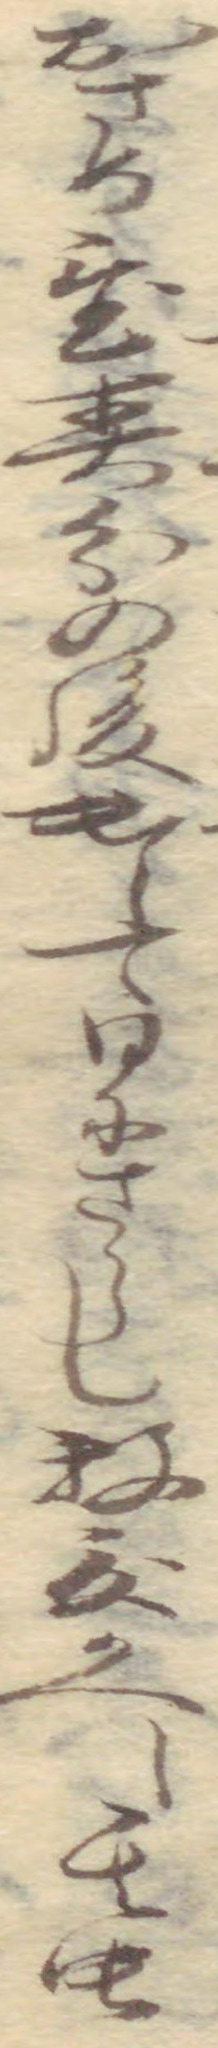おさめ置春分の後出して日にさらし数度かへし其虫
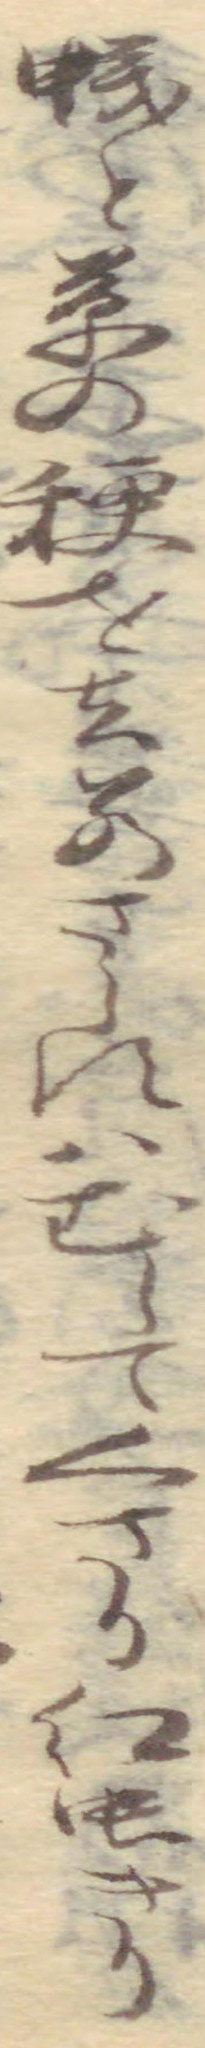蟻と草の稉を去若さらすハむしてくさり紅虫きり
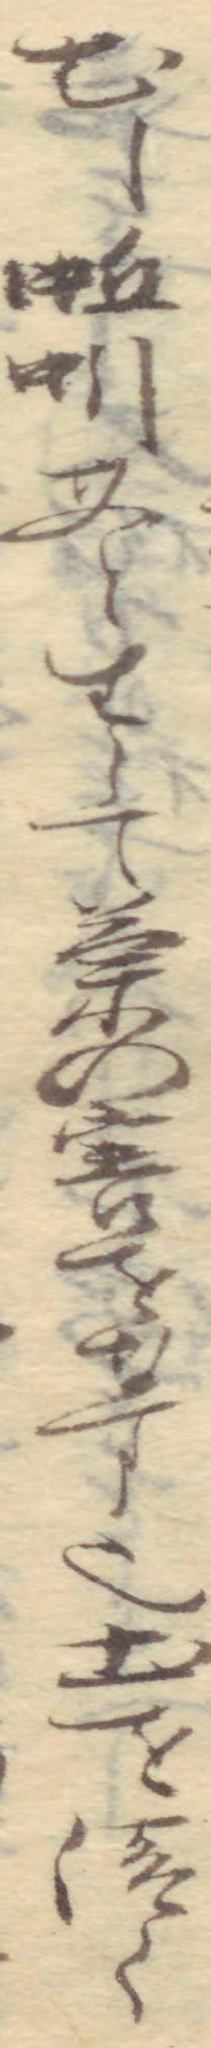むし蚯蚓なと生して菊の害をなす也土を清く
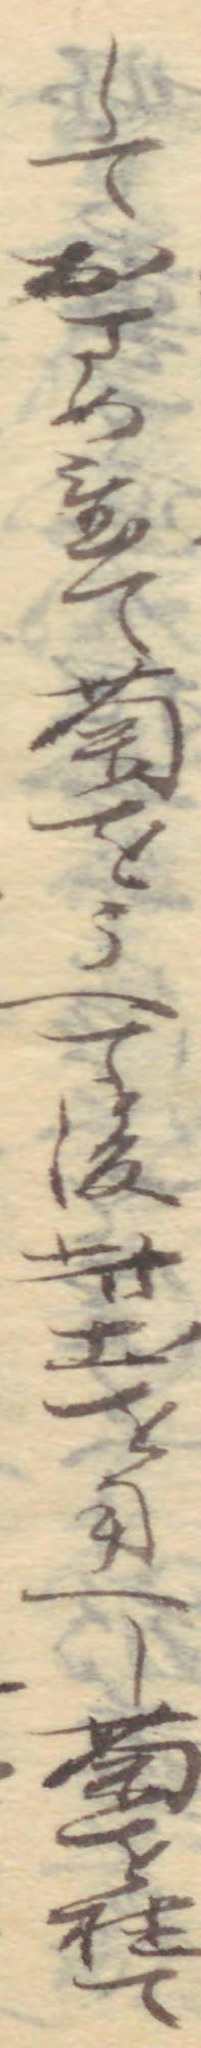しておさめ置て菊をうへて後此土を用へし菊を植て
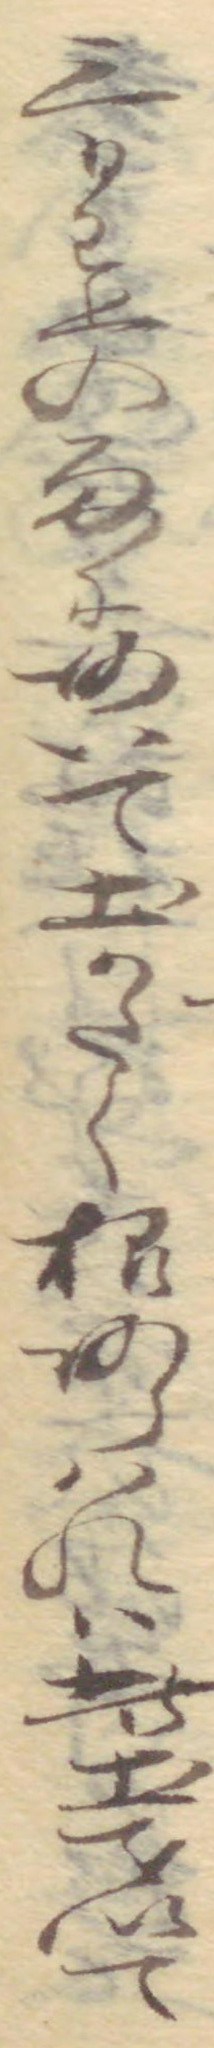三日已上の雨にあいて土かたく根あらハれハ此土を以て
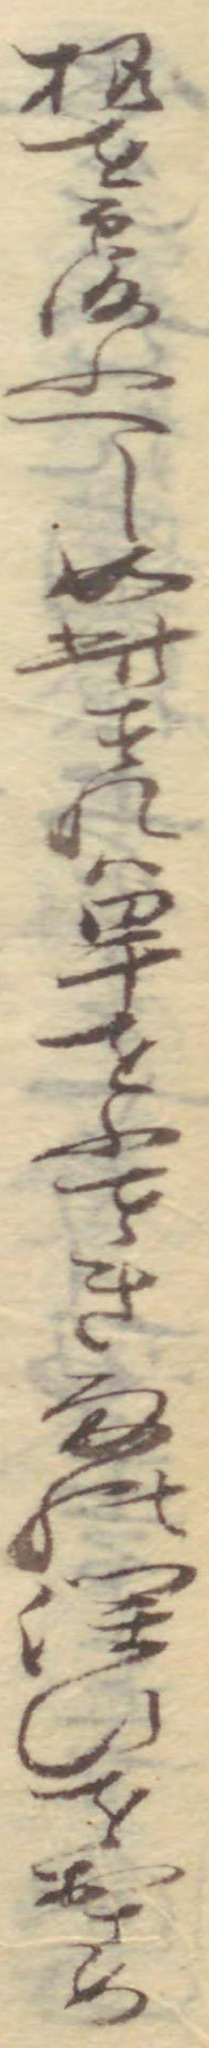根を覆ふへし如此すれハ旱をふせき雨の潤ひをおさめ
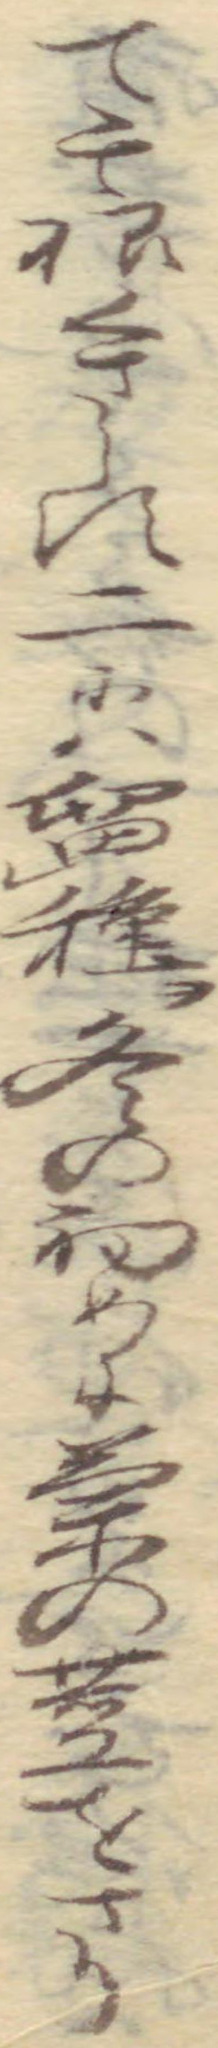て其根くさらすニにハ留種冬の初めに菊の茎をさり
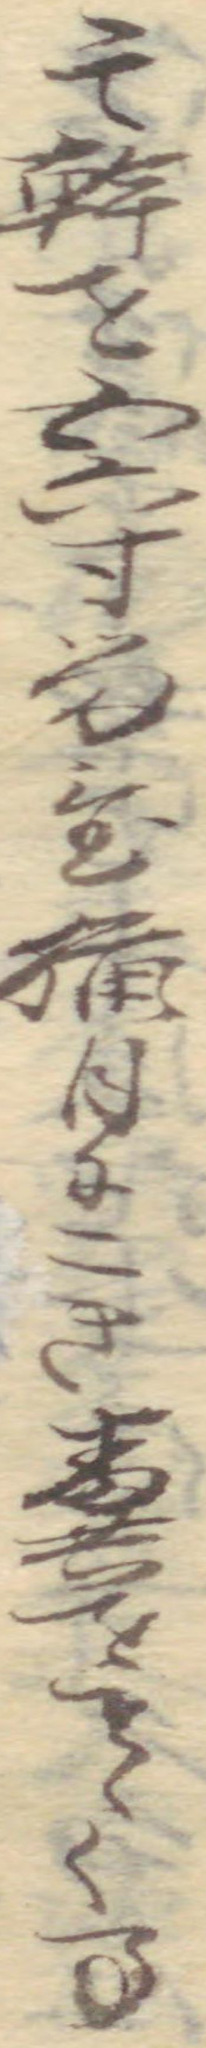其幹を五六寸留置猟月にこき糞をそゝく事
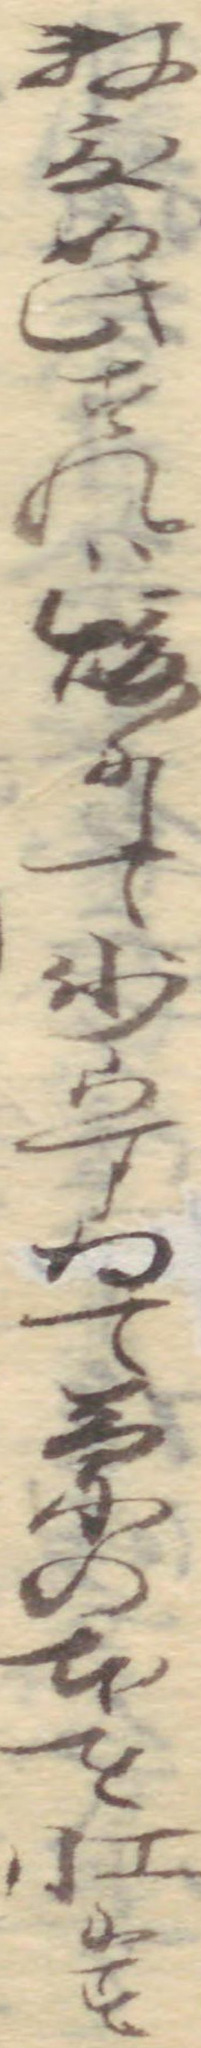数度如此すれハ煖にして氷らす為て菊の本を壮にす
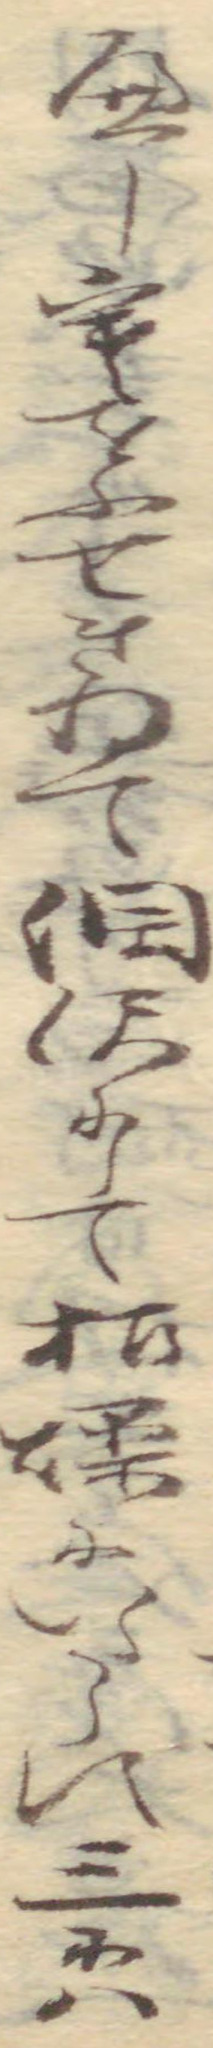へし寒をふせき為て潤沢にして枯燥にいたらす三にハ
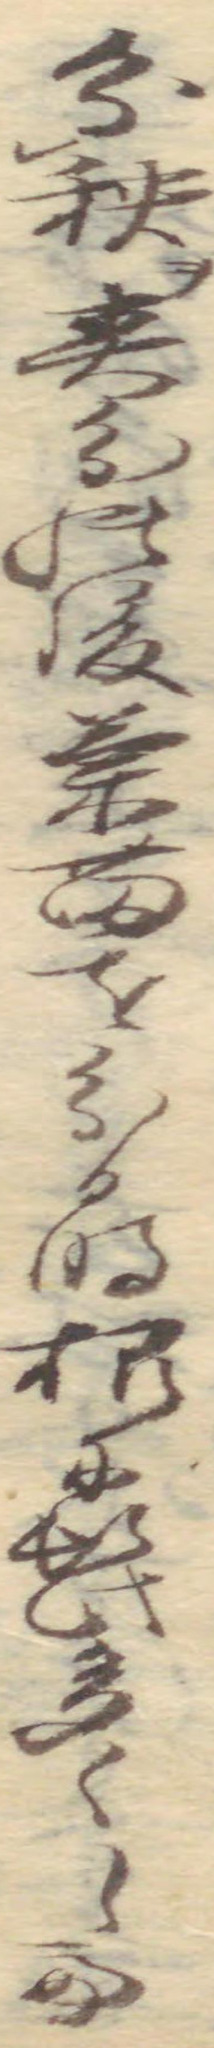分秧春分の後菊苗を分る時根に髭多くして
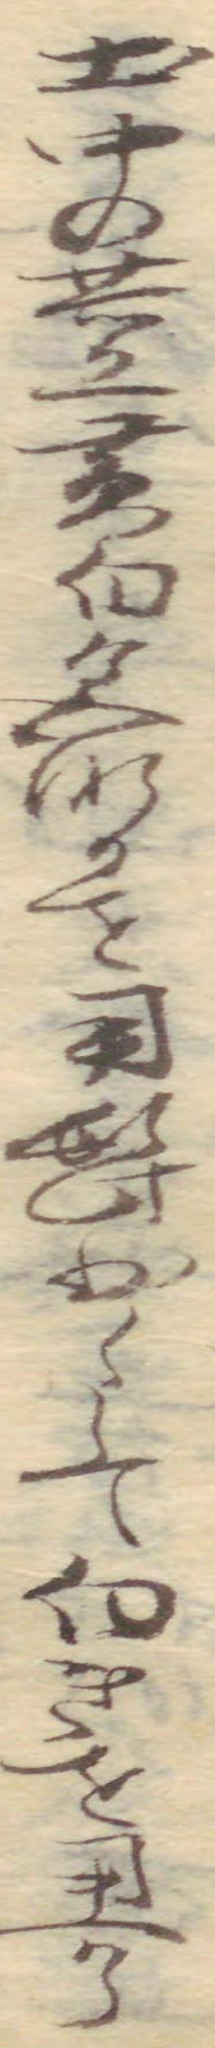土中の茎黄白色なるを用髭少くして白きを用へから
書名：鶯宿雑記. 巻199-200
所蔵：国立国会図書館 National Diet Library, JAPAN
